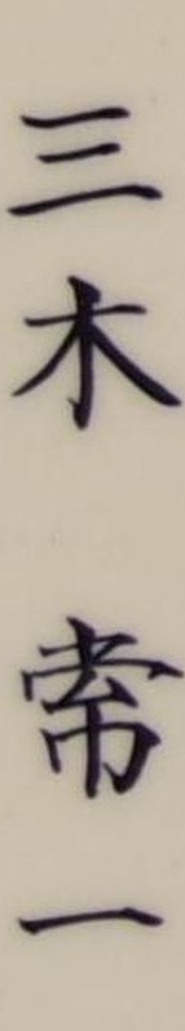三木常一
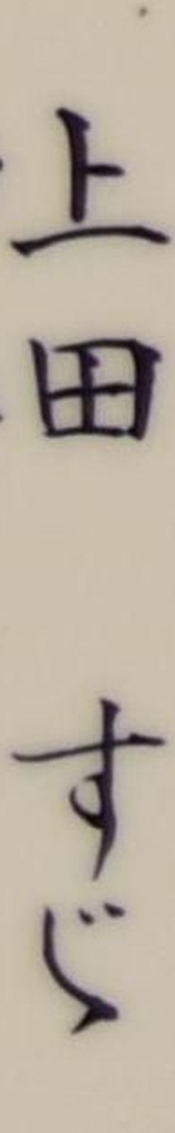上田すだ
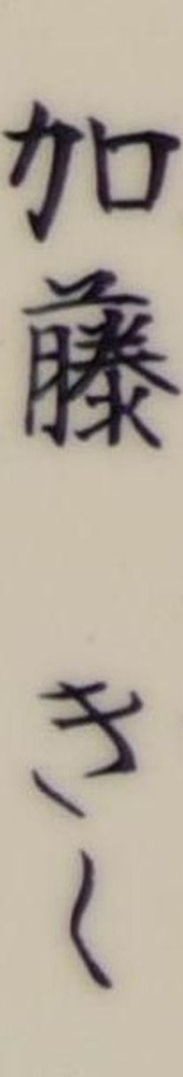加藤きく
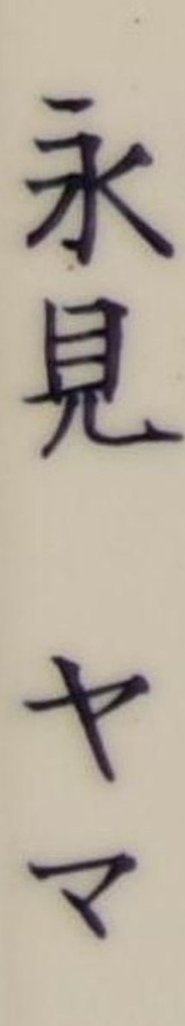永見ヤマ

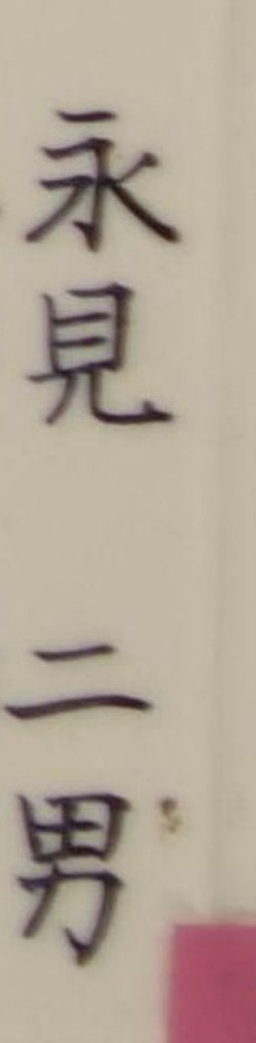永見二男
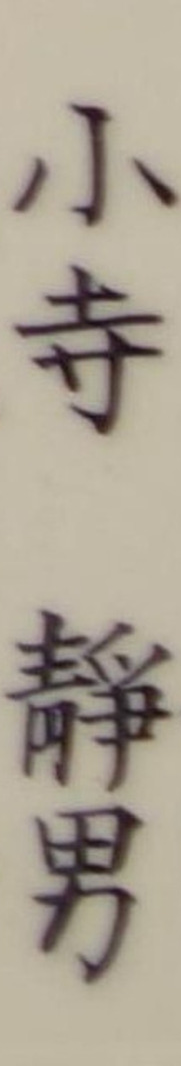小寺静男
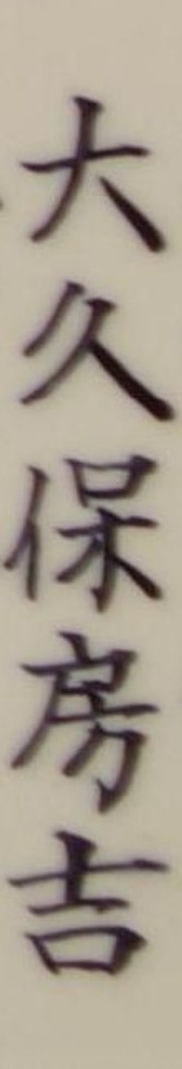大久保房吉
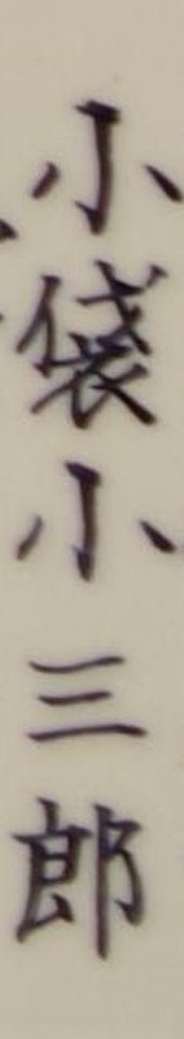小袋小三郎
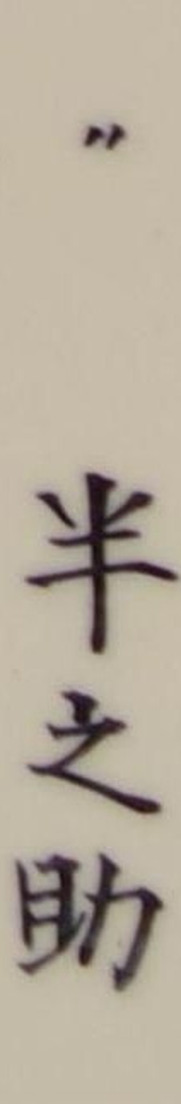半之助
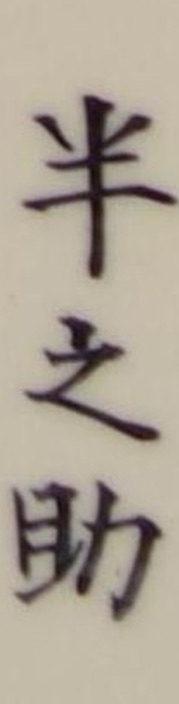半之助
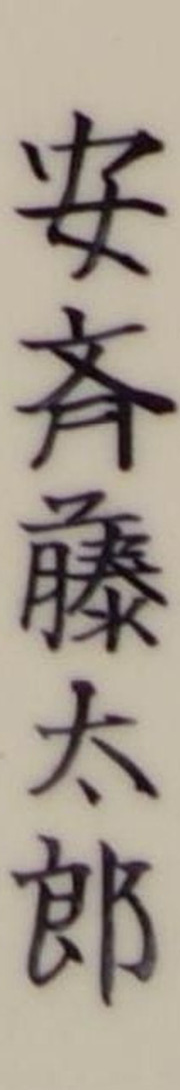安斉藤太郎
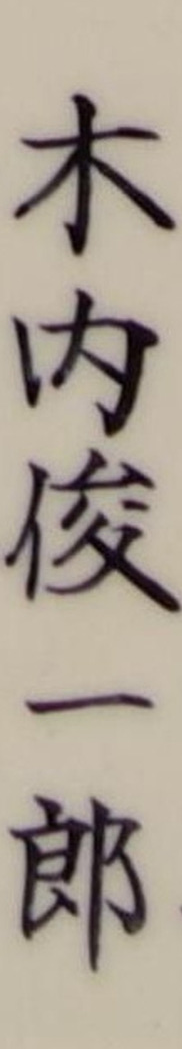木内俊一郎
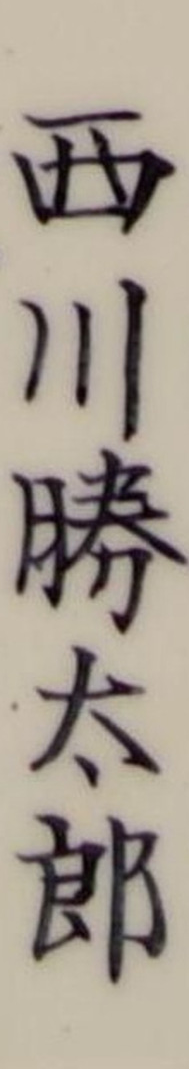西川勝太郎
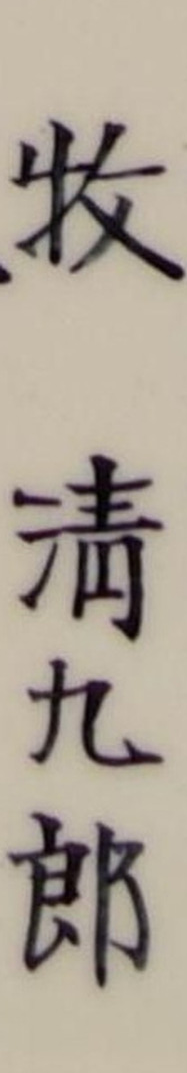牧清九郎
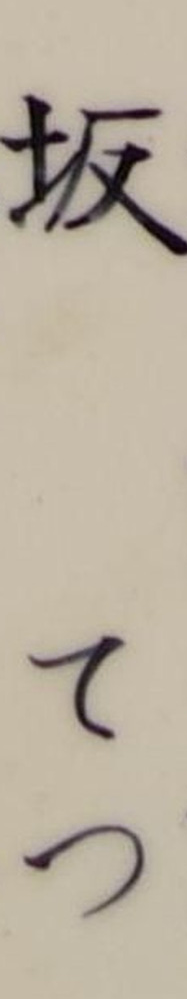坂てつ
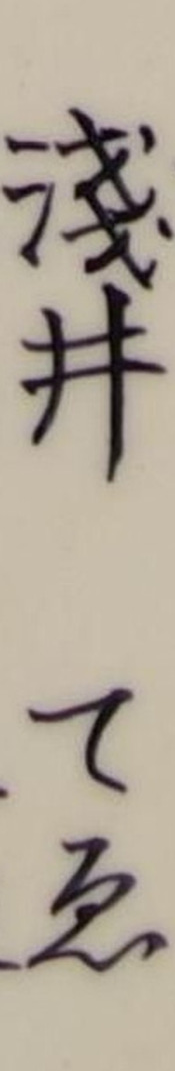浅井てゑ
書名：M~S
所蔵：高野山金剛峯寺
